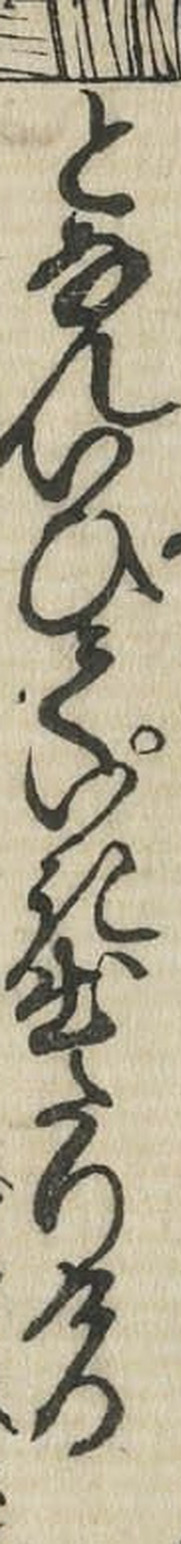となんいひて。いき出たりける
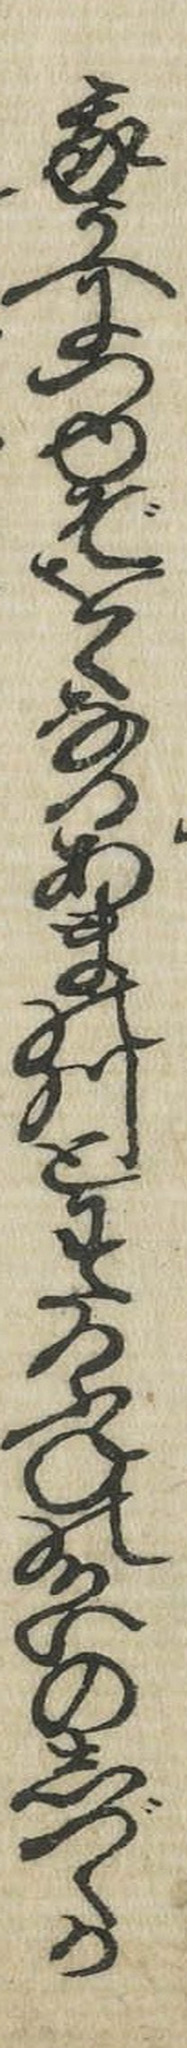我うへにつゆぞをくなるあまの川とわたるふねのかいのしづくか
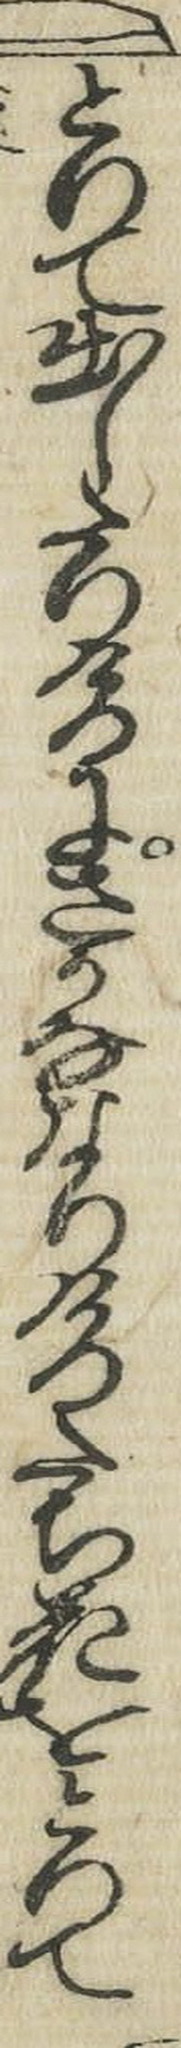とりて出したりけるに。さかななりけるたち花をとりて
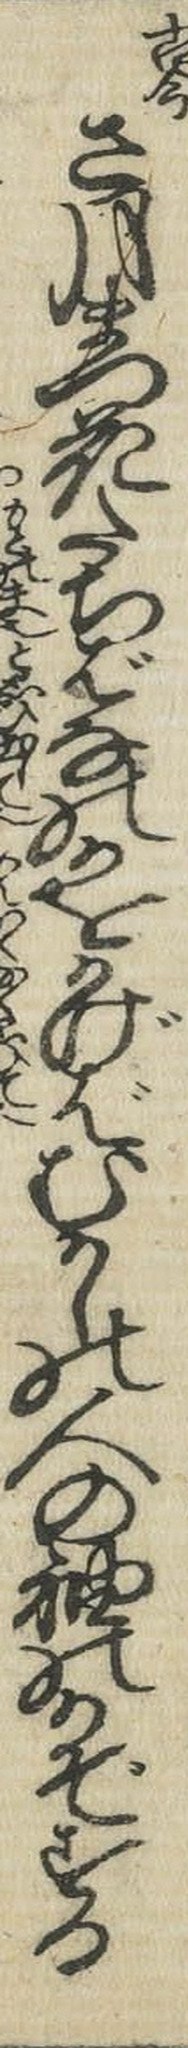古今さ月まつ花たちばなのかをかげばむかしの人の袖のかぞする
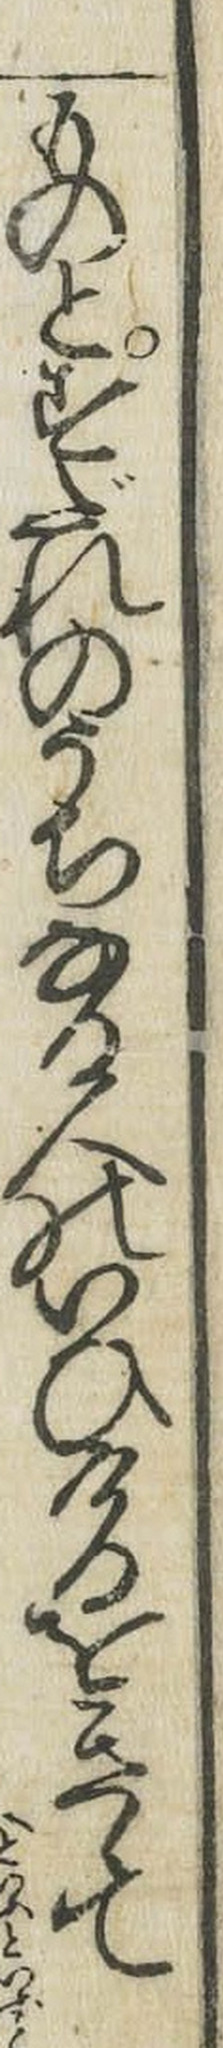ものと。すだれのうちなる人のいひけるをきゝて
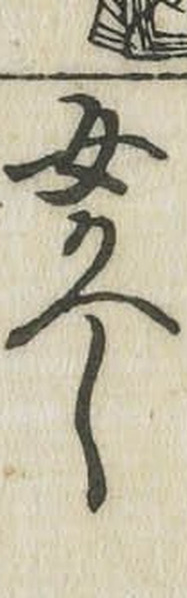女かへし
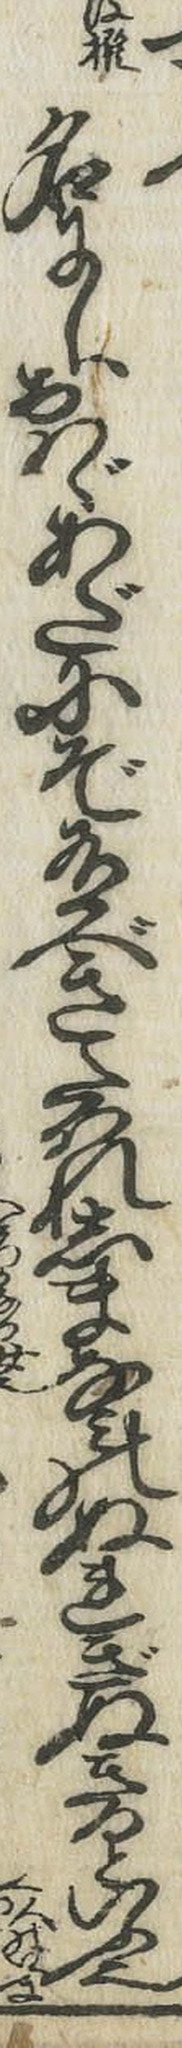後撰名にしおはゞあだにぞ有べきたはれしまなみのぬれぎぬきるといふ也
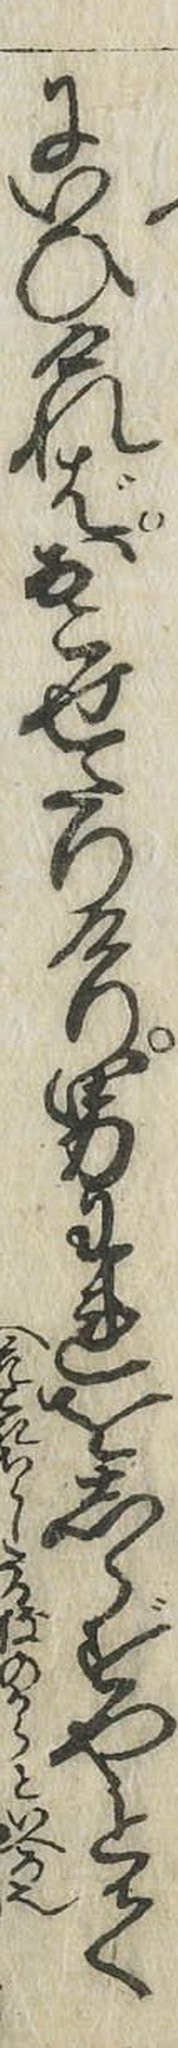にいひければ。おこせたりけり。男われをしらずやとて
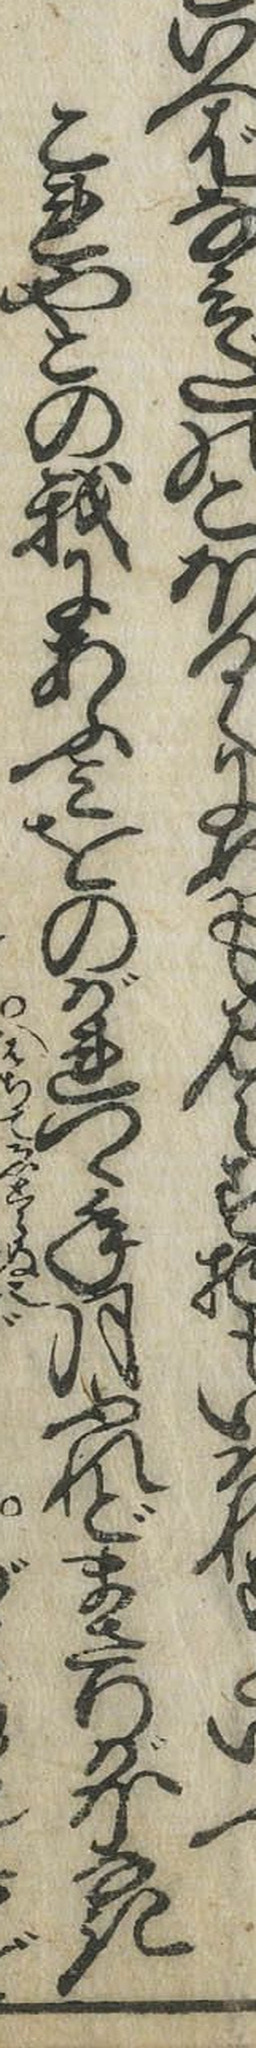これやこの我にあふみをのがれつゝ年月ふれどまさりがほなき

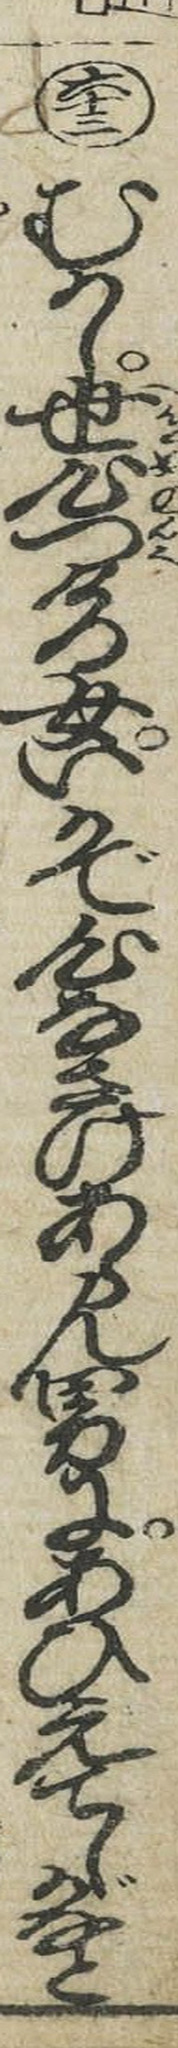(六十三)むかし。世心つける女。いかで心なさけあらん男に。あひえてしがなと
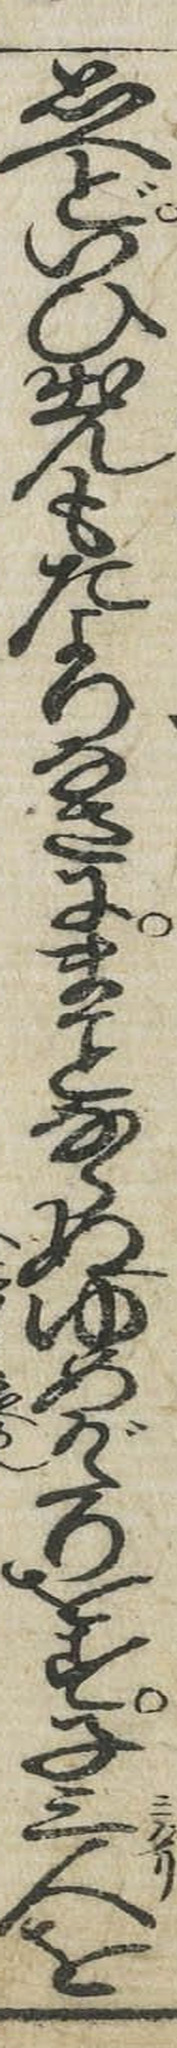思へど。いひ出んもたよりなさに。まことならぬゆめがたりをす。子三人を
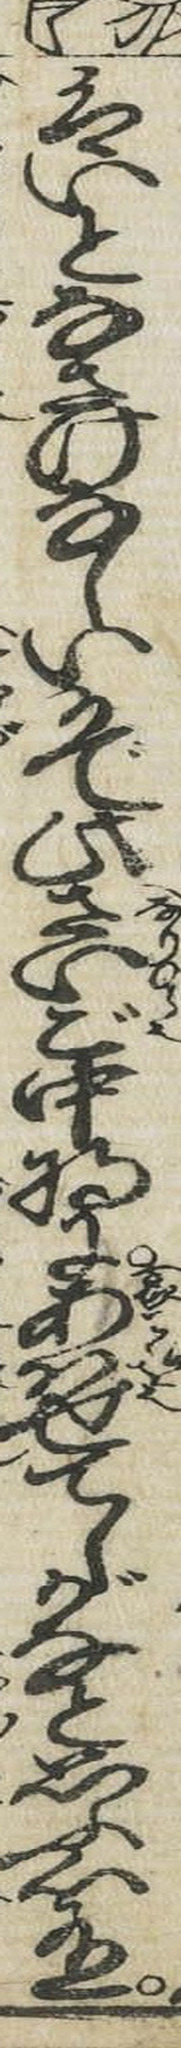はいとなさけなしいかで此さいご中将に。あはせてしがなと思ふ心有。
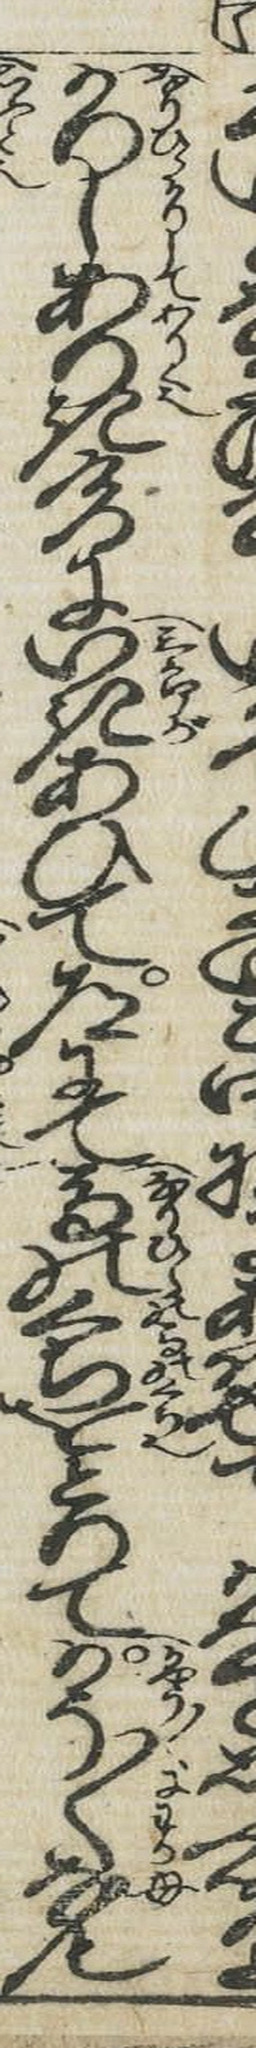かりしありきけるにいきあひて。道にて馬のくちをとりて。かう〳〵なん
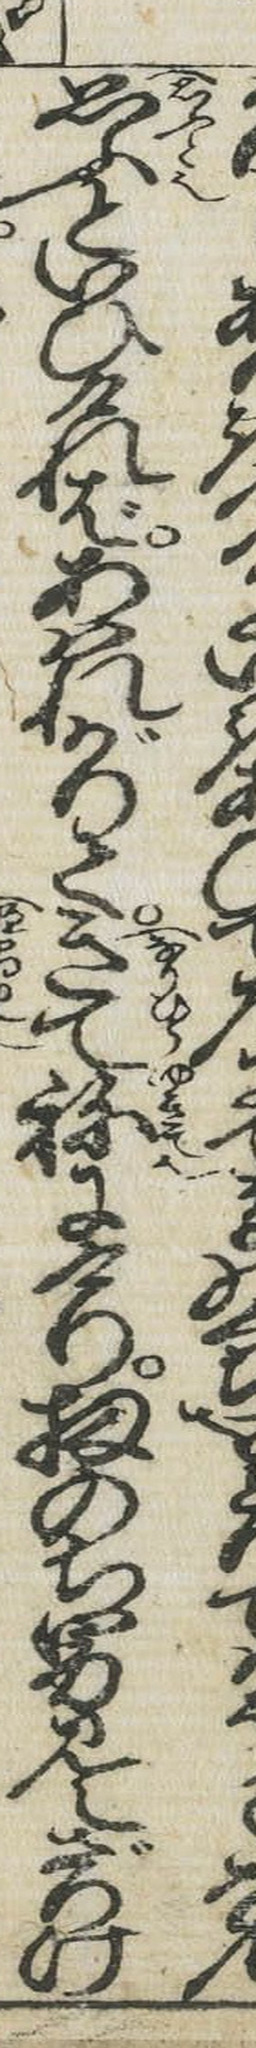思ふといひければ。あはれがりて。きてねにけり。扨のち男みえざりけ
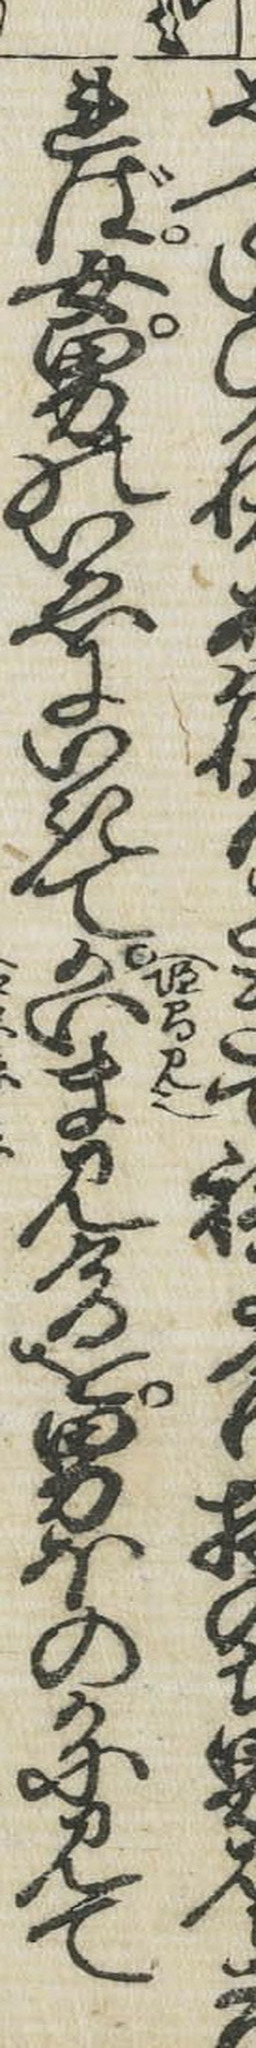れば。女。男のいゑにいきて。かいま見けるを。男ほのかに見て
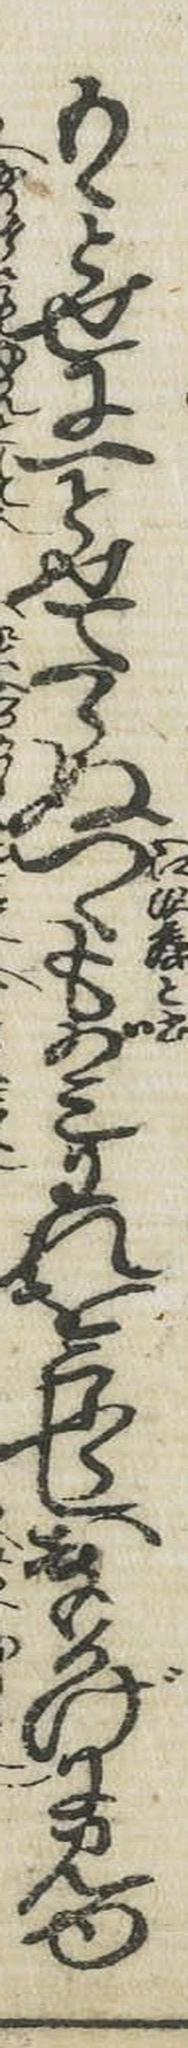もゝとせに一とせたらぬつくもがみわれをこふらしおもかげに見ゆ
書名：新板絵入伊勢物語 : かうしやく付 2巻 下
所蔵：東京学芸大学教育コンテンツアーカイブ
